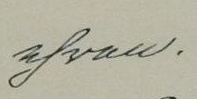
ehren.
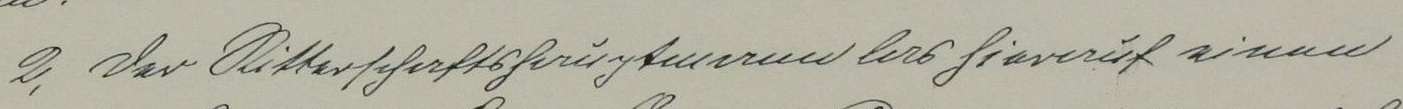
2. Der Ritterschaftshauptmann las hierauf einen
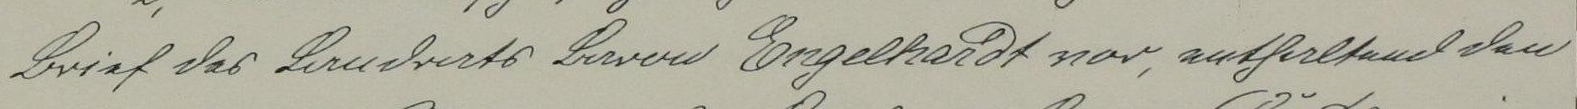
Brief des Landrats Baron Engelhardt vor, enthaltend den
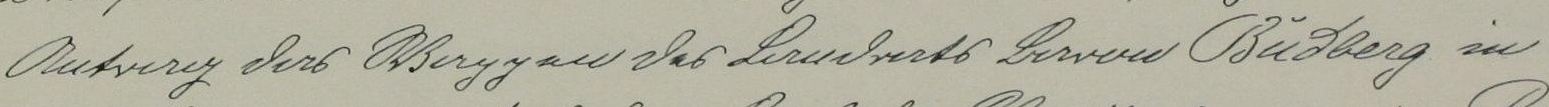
Antrag das Wappen des Landrats Baron Budberg in
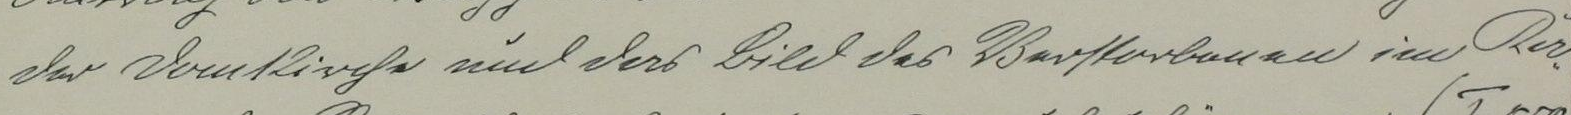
der Domkirche und das Bild des Verstorbenen im Ka-
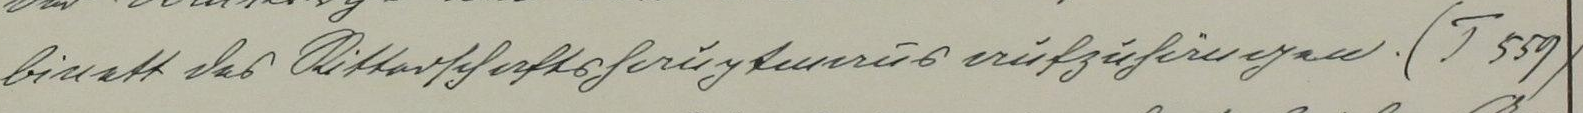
binett des Ritterschaftshauptmanns aufzuhängen. (T.559)
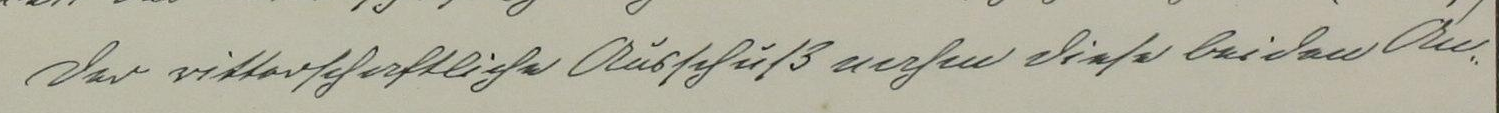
Der ritterschaftliche Ausschuß nahm diese beiden An-
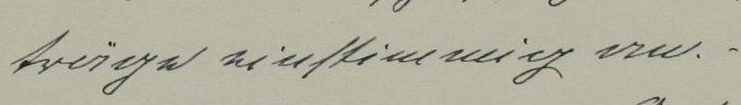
träge einstimmig an.
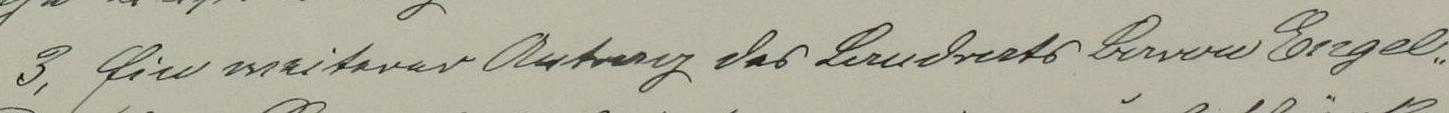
3. Ein weiterer Antrag des Landrats Baron Engel-
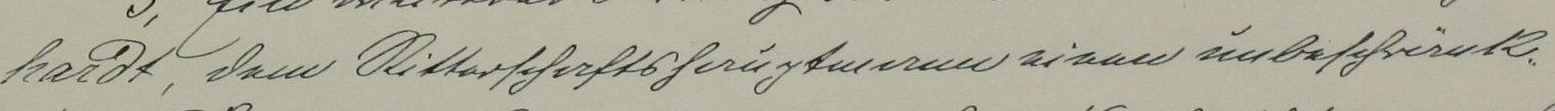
hardt, dem Ritterschaftshauptmann einen unbeschränk-
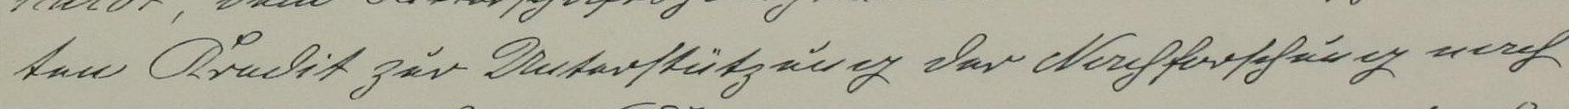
ten Kredit zur Unterstützung der Nachforschung nach
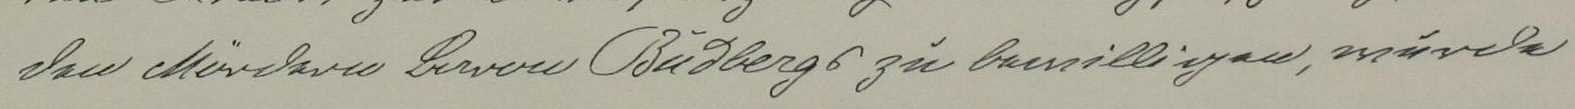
den Mördern Baron Budbergs zu bewilligen, wurde
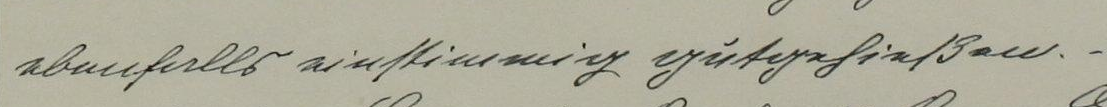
ebenfalls einstimmig gutgehießen.
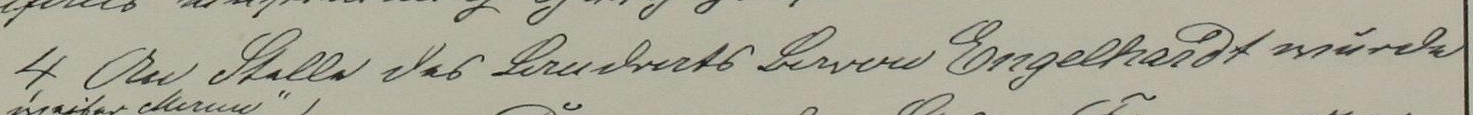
4. An Stelle des Landrats Baron Engelhardt wurde
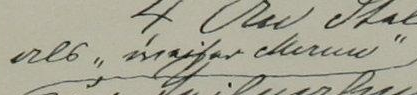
als „weiser Mann“
